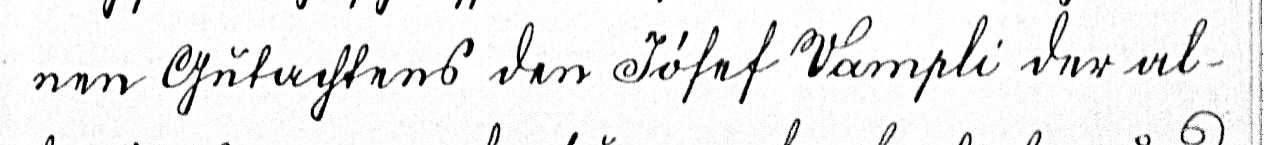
nen Gutachtens den Jósef Vampli der al¬
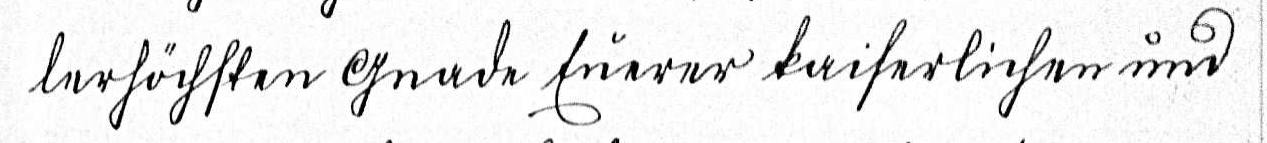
lerhöchsten Gnade Euerer kaiserlichen und
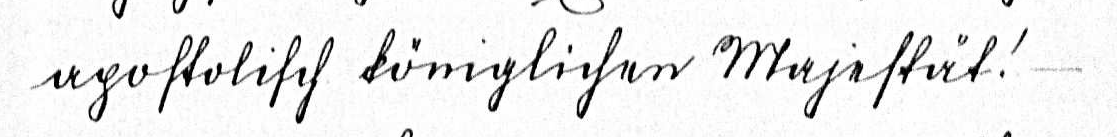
apostolisch königlicher Majestät!
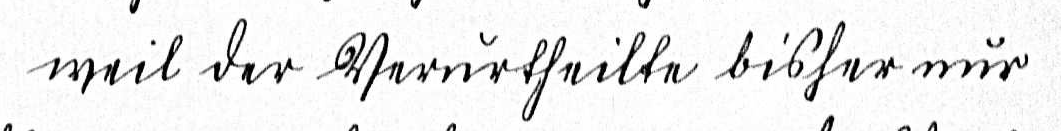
Weil der Verurtheilte bisher nur
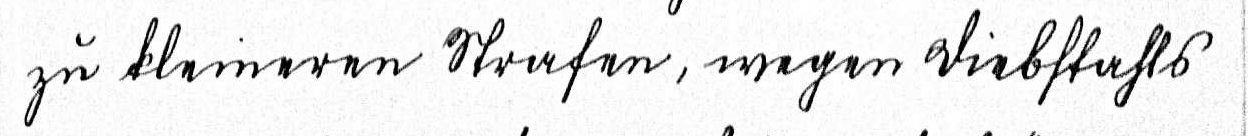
zu kleineren Strafen, wegen Diebstahles
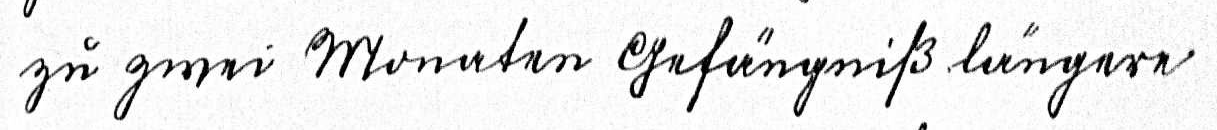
zu zwei Monaten Gefängniß längere
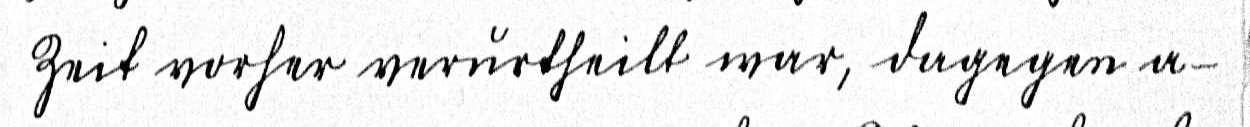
Zeit vorher
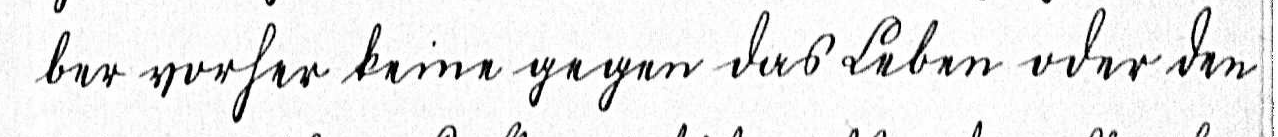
keine gegen das Leben oder den
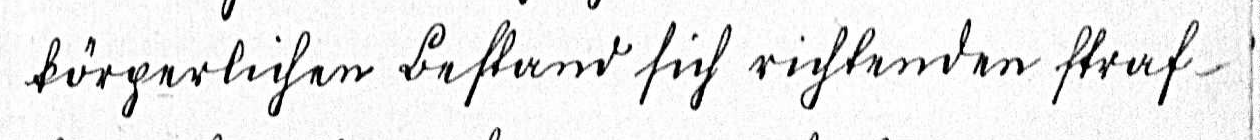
bürgerlichen Bestand sich richtenden straf¬
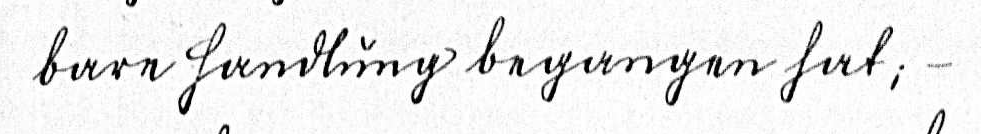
bare Handlung begangen hat; –
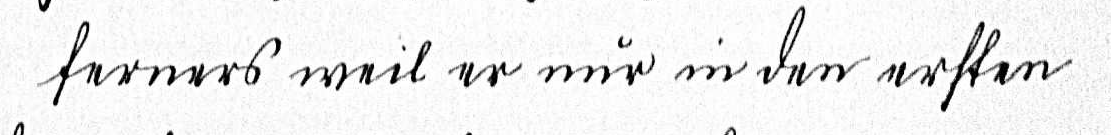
Ferners weil er nur in den ersten
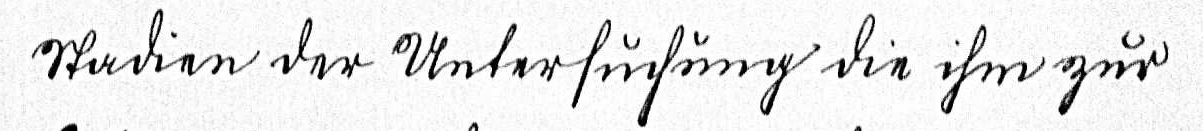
Stadien der Untersuchung die ihm zur
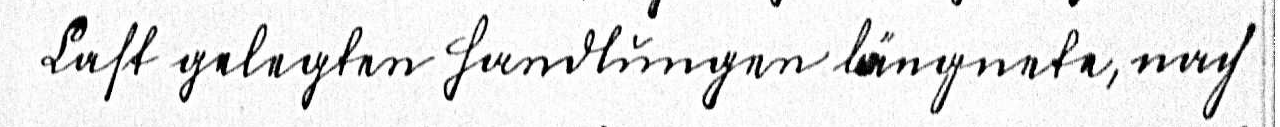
Last gelegten Handlungen läugnete, nach
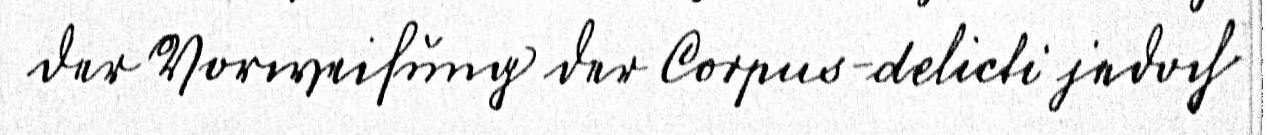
der Vorweisung der Corpus-delicti jedoch
